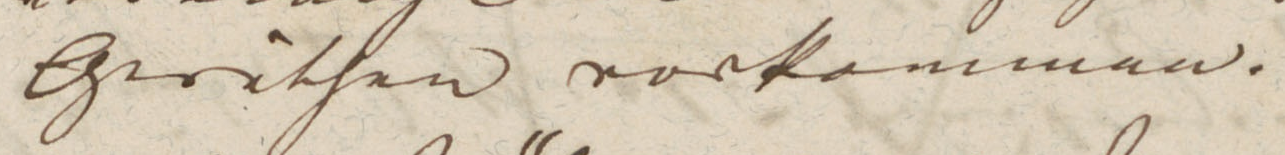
Geräthen vorkommen.
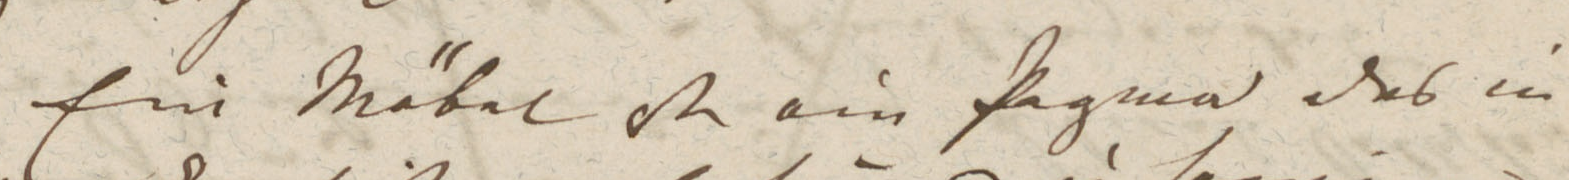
Ein Möbel ist ein Pegma das in
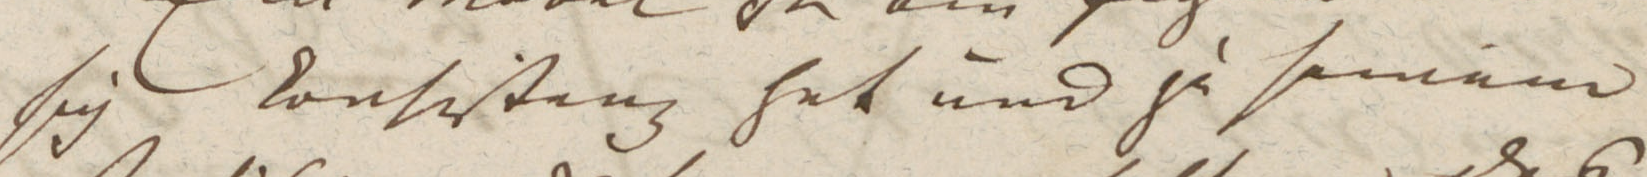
sich konsistenz hat und zu seinem
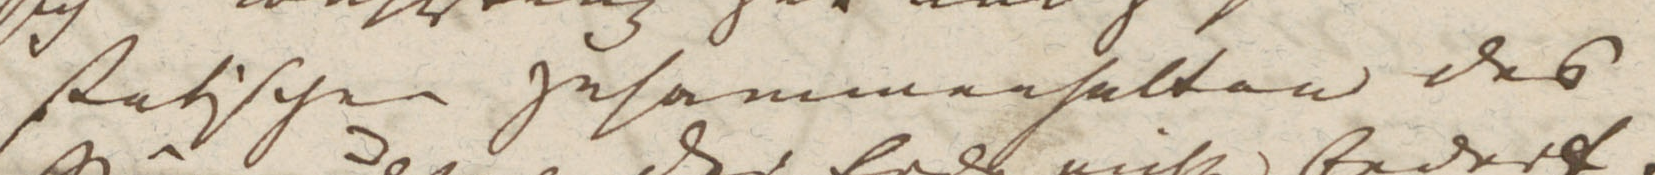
statischen zusammenhalten des
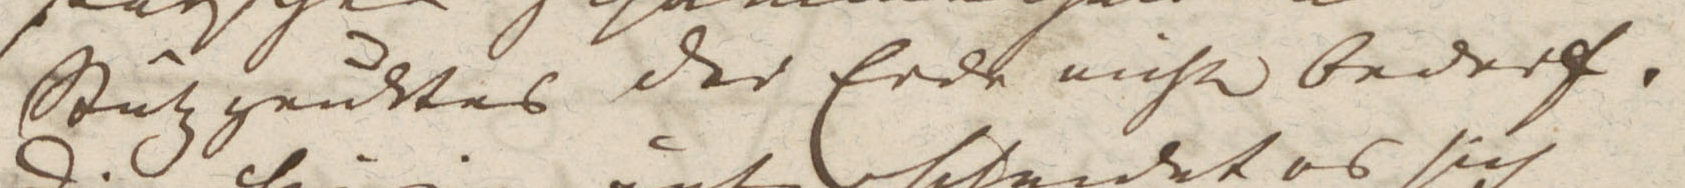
Stützpunktes der Erde nicht bedarf.
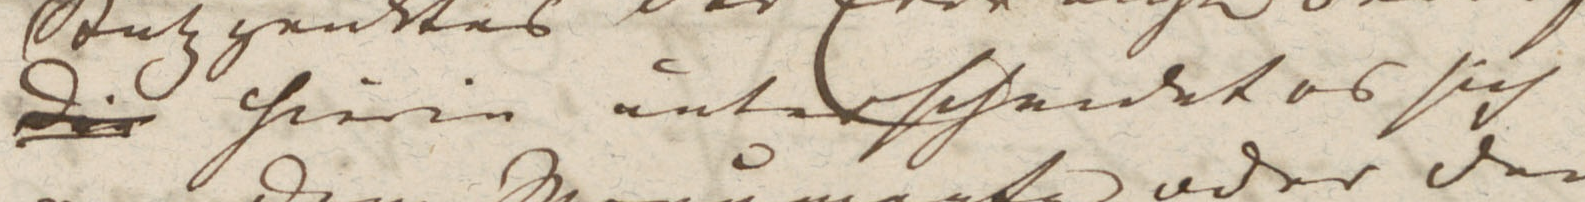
Die Hierin unterscheidet es sich
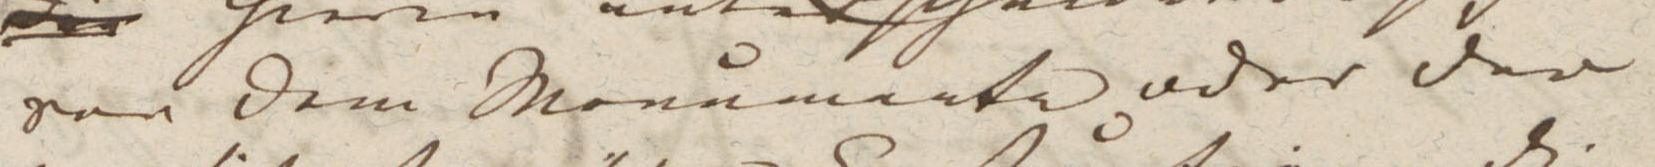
von dem Monumente oder der
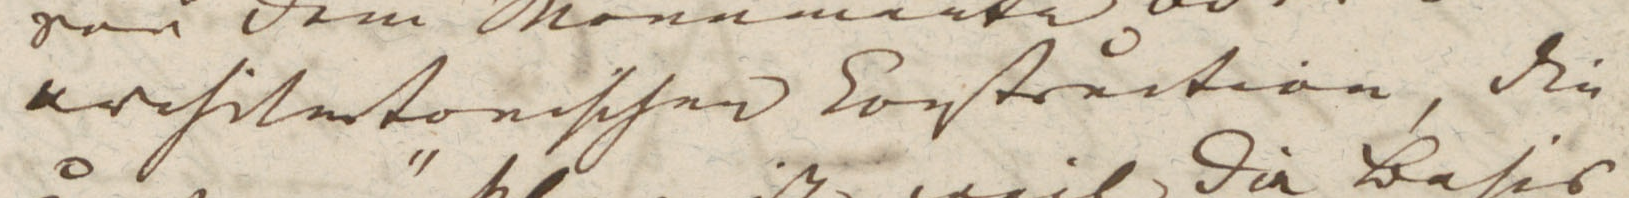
architectonischen Construction, die
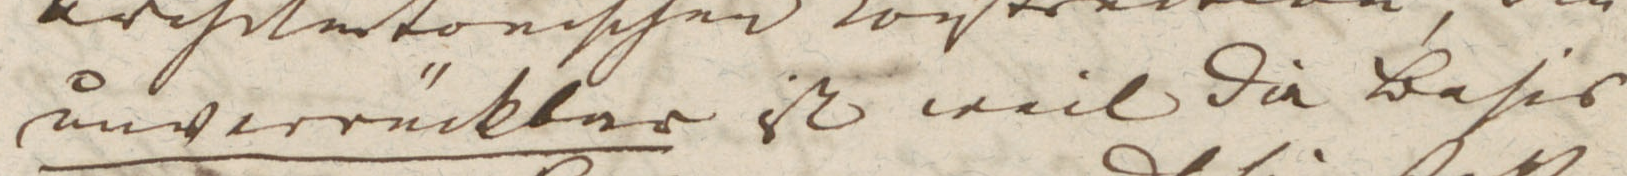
unverrückbar ist weil die Basis
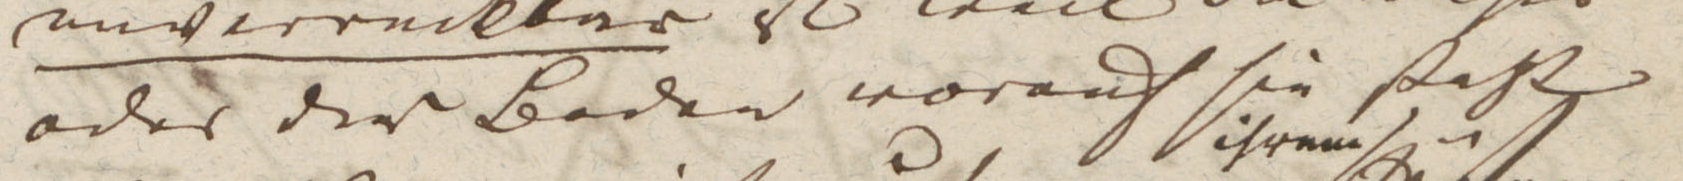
oder der Boden worauf sie steht
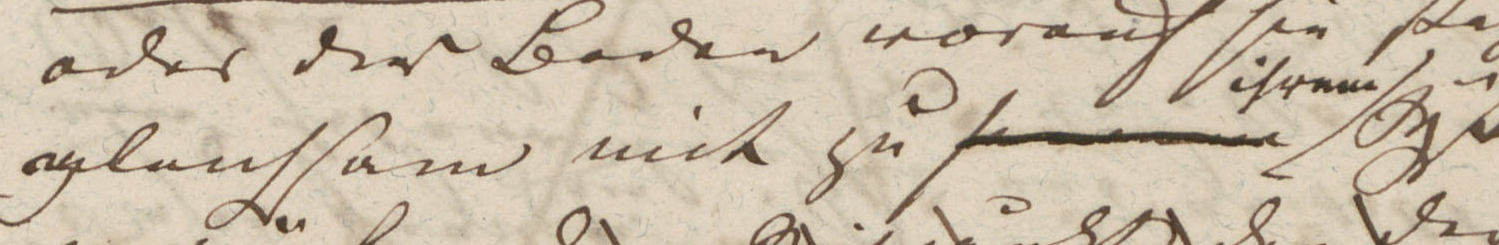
gleichsam mit zu seinem ihrem
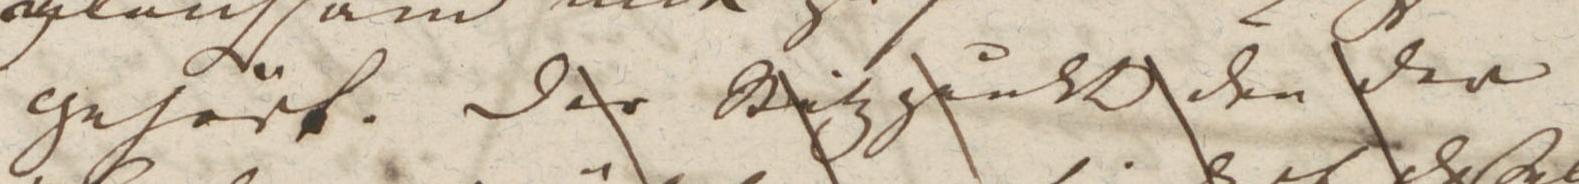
gehört. Der Stützpunkt den der
